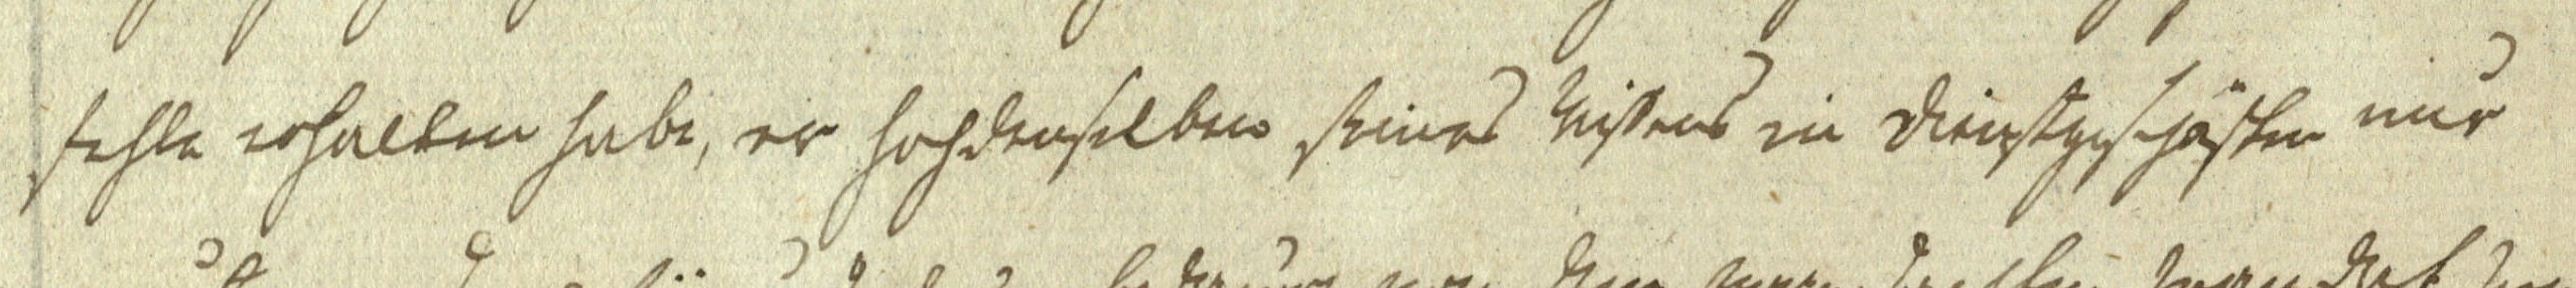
fehle erhalten habe, er hochdenselben seines Wissens in Dienstgeschäften nur
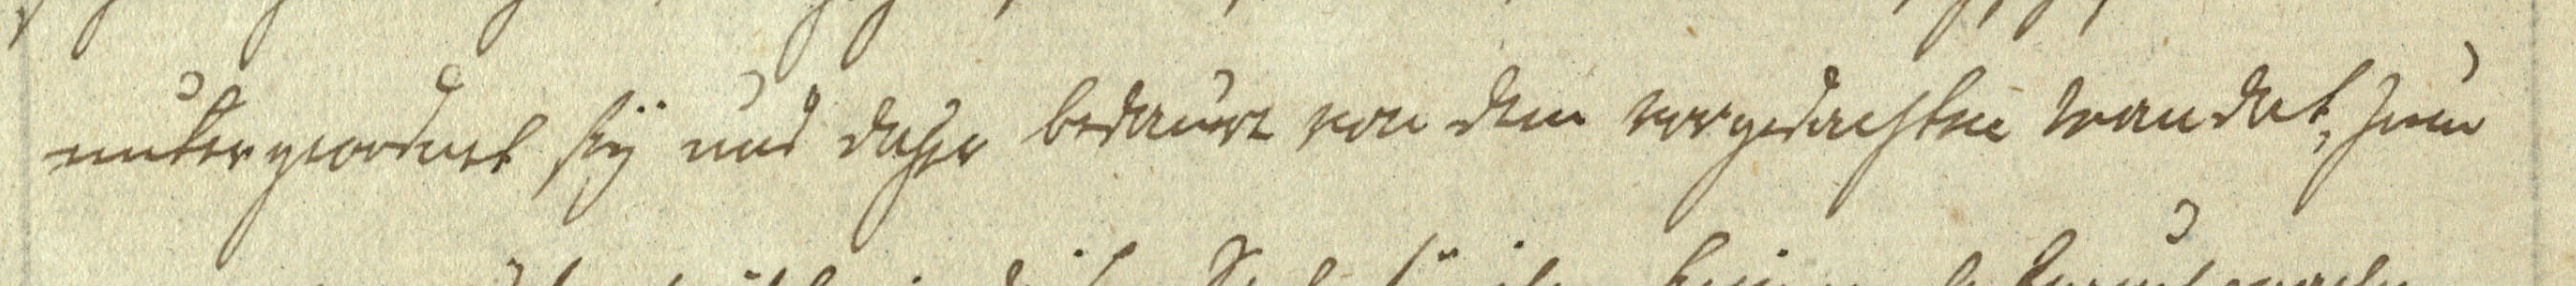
untergeordnet seÿ und daher bedaure von dem vorgedachten Mandat, zum
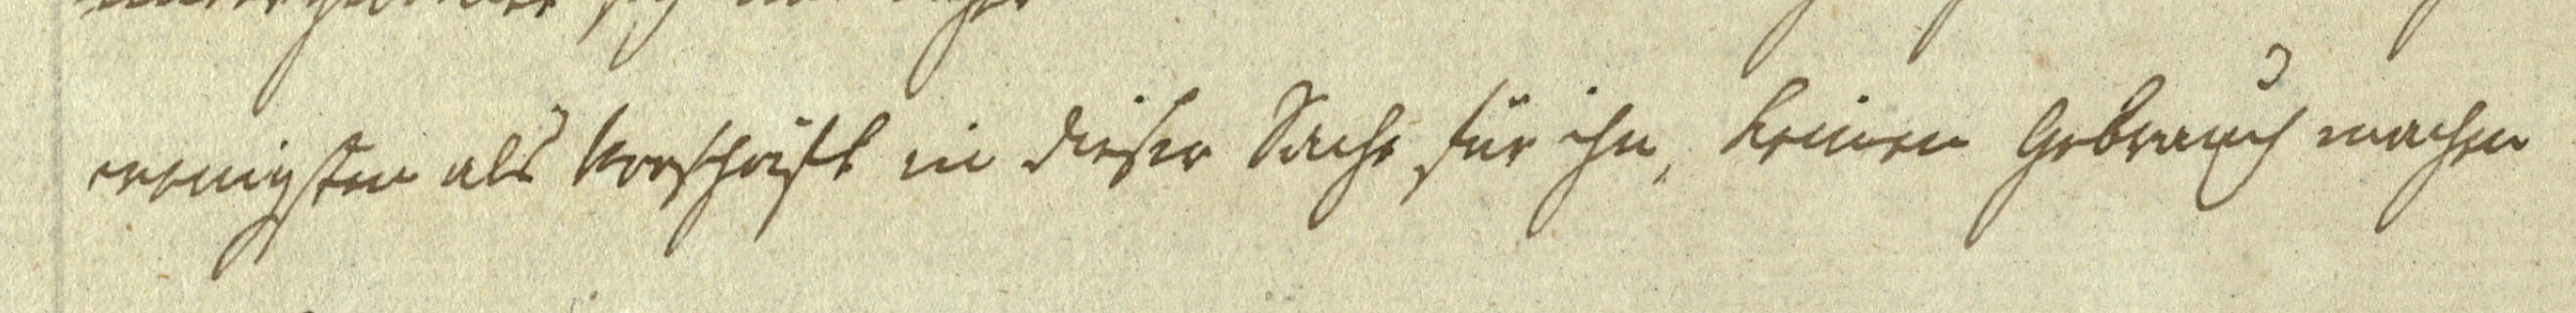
wenigsten als Vorschrift in dieser Sache für ihn, keinen Gebrauch machen
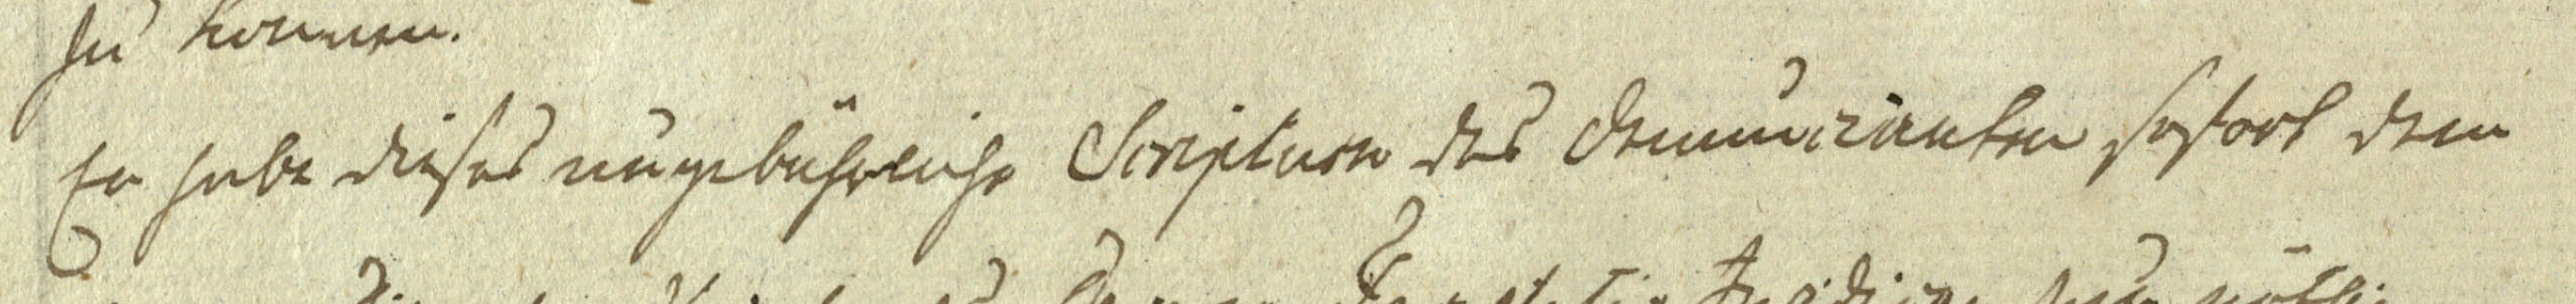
Er habe dieses ungebührliche Scriptum des Denuncianten sofort dem
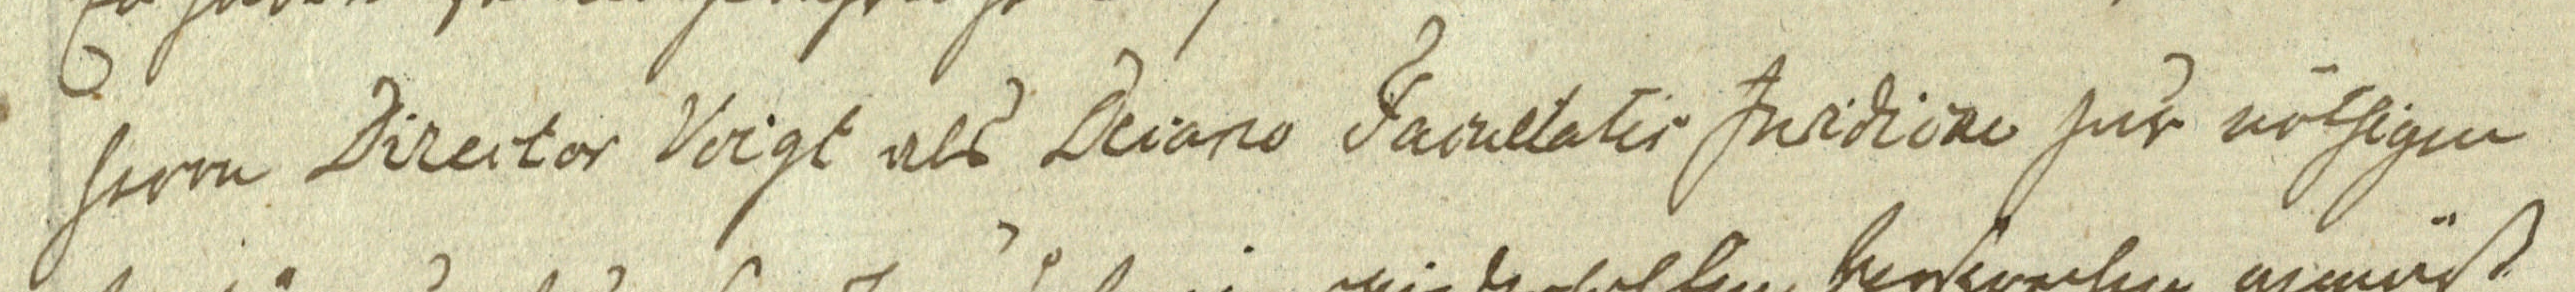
Herrn Director Voigt als Decano Facultatis Juridicae zur nöthigen
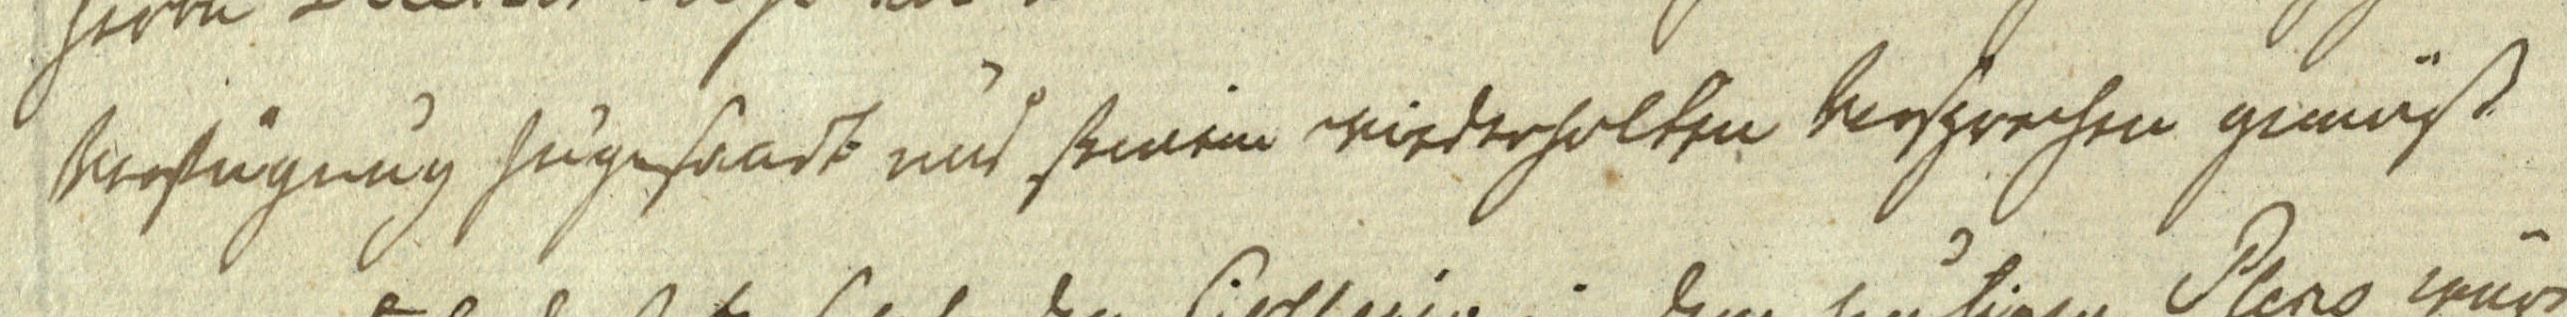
Verfügung zugesandt und seinem wiederholten Versprechen gemäß
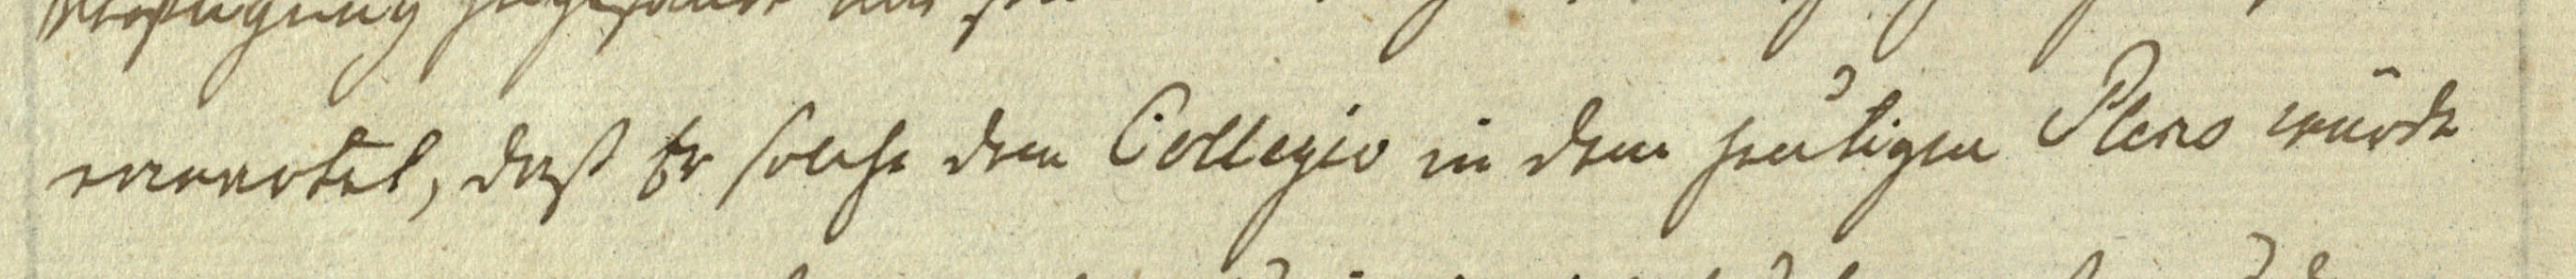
erwartet, daß Er solche dem Collegio in dem heutigen Pleno würde
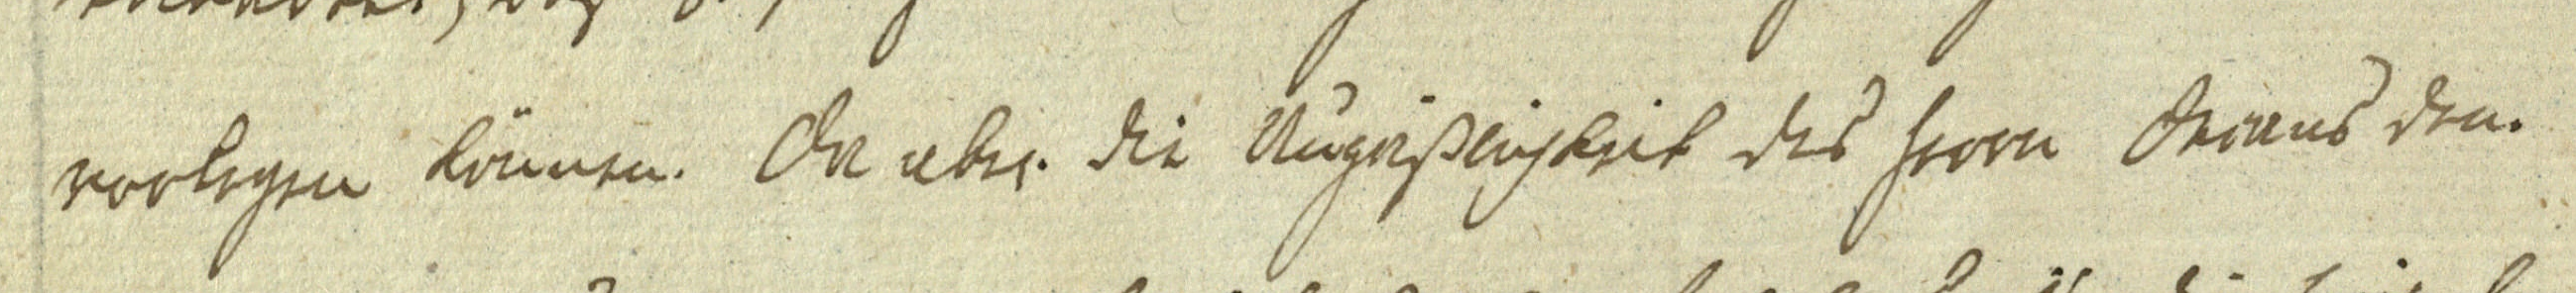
vorlegen können. Da aber die Unpäßlichkeit des Herrn Decans den¬
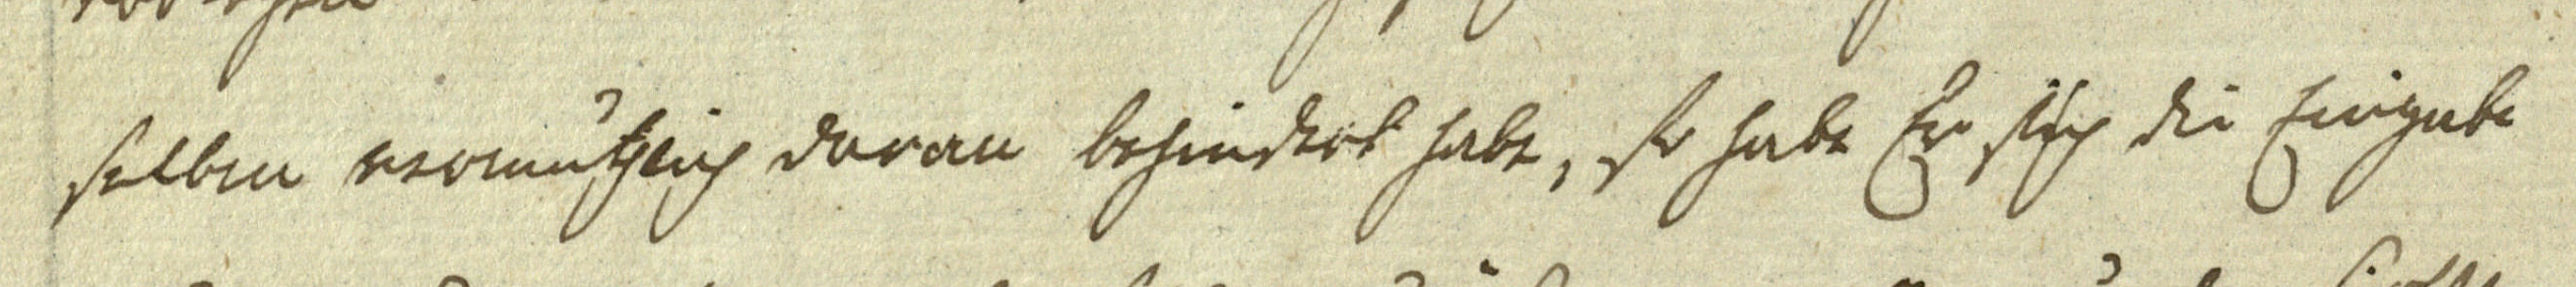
selben vermuthlich daran behindert habe, so habe Er sich die Eingabe
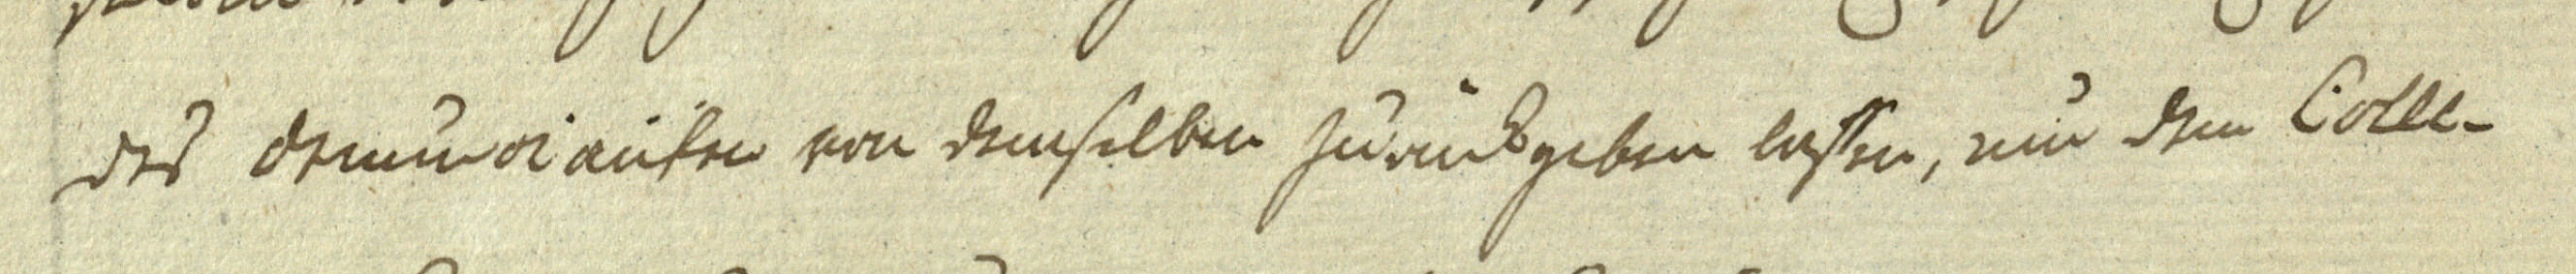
des Deununcianten von demselben zurückgeben lassen, um dem Colle¬
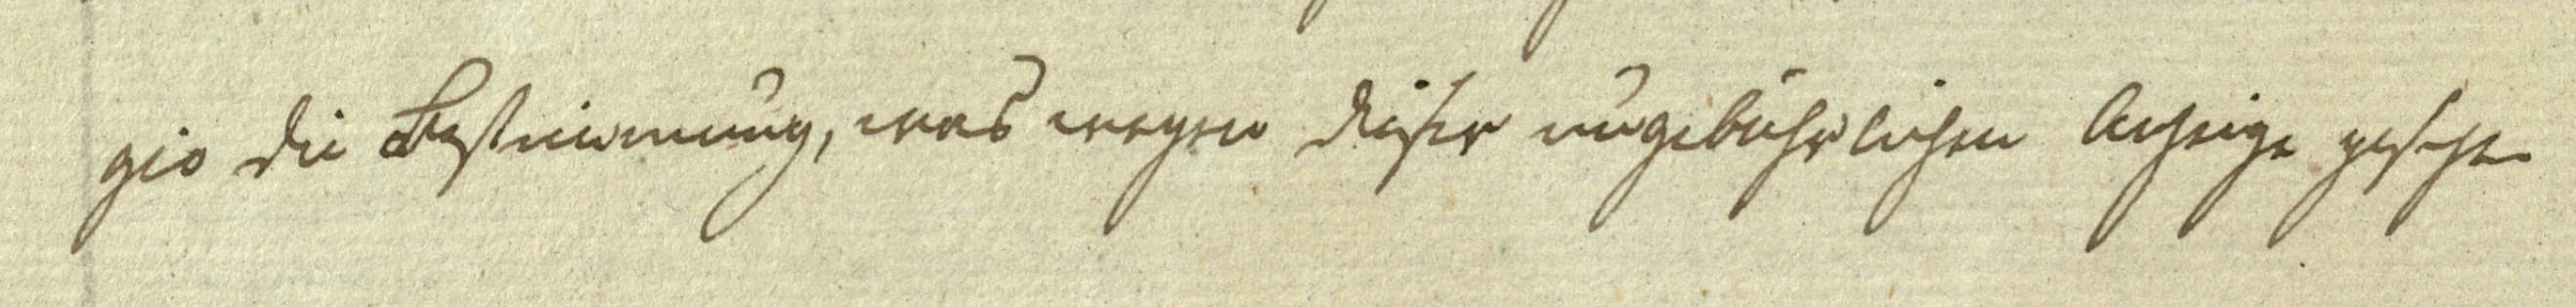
gio die Bestimmung, was wegen dieser ungebührlichen Anzeige gesche¬
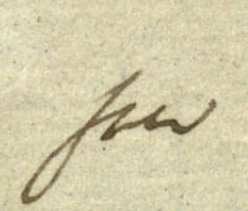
hen
